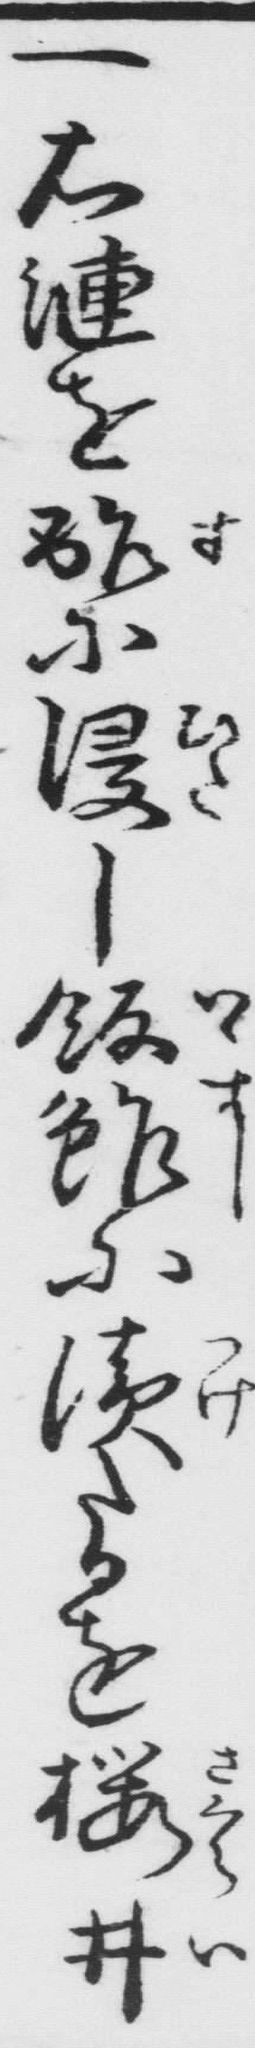一右漣を酢に浸し飯鮓に漬たるを桜井
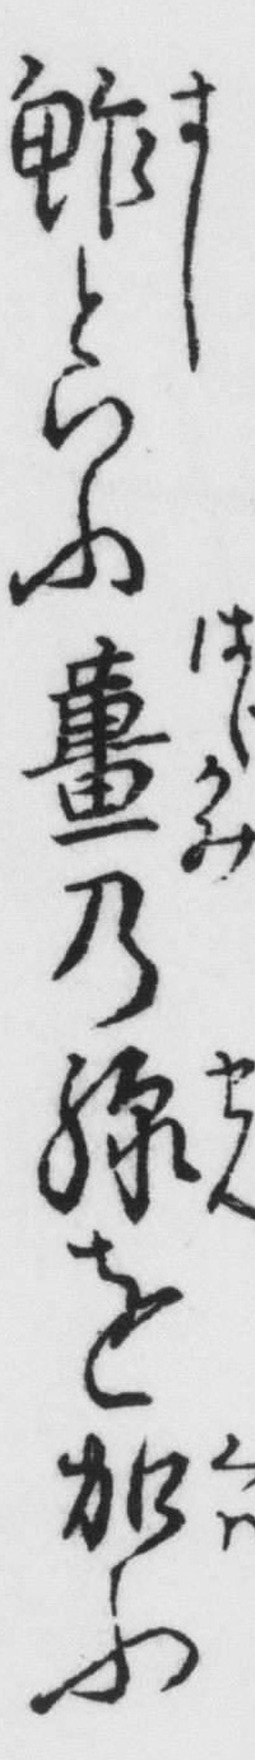鮓といふ薑の線を加ふ
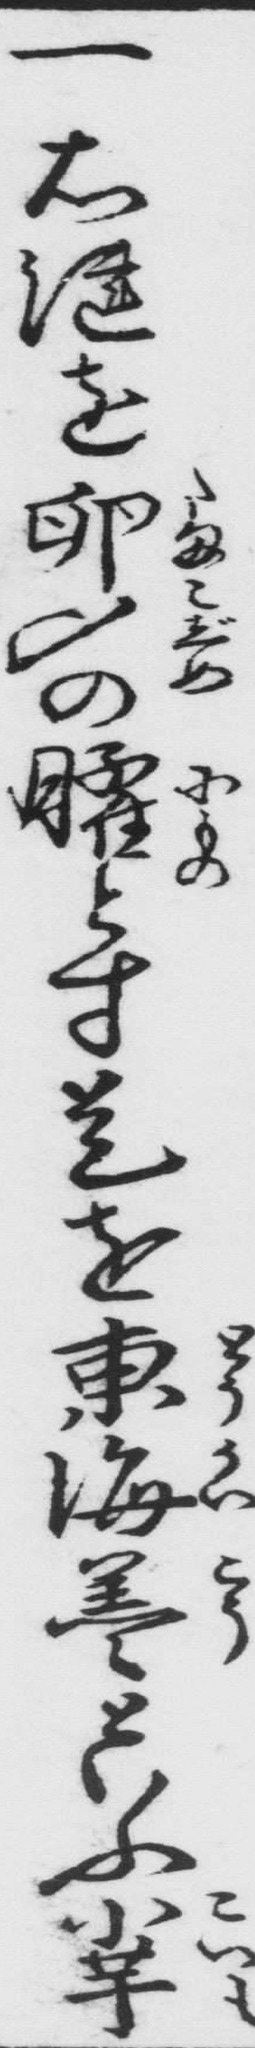一右漣を卵〆の臛とす是を東海羹といふ小芋
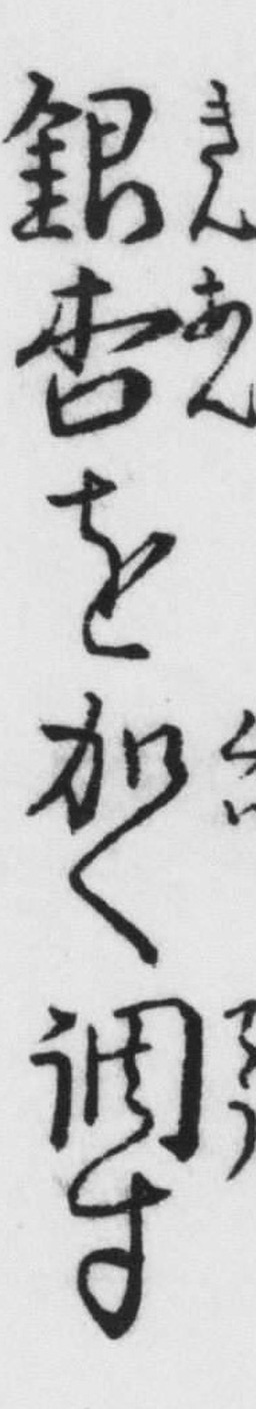銀杏を加へ調す
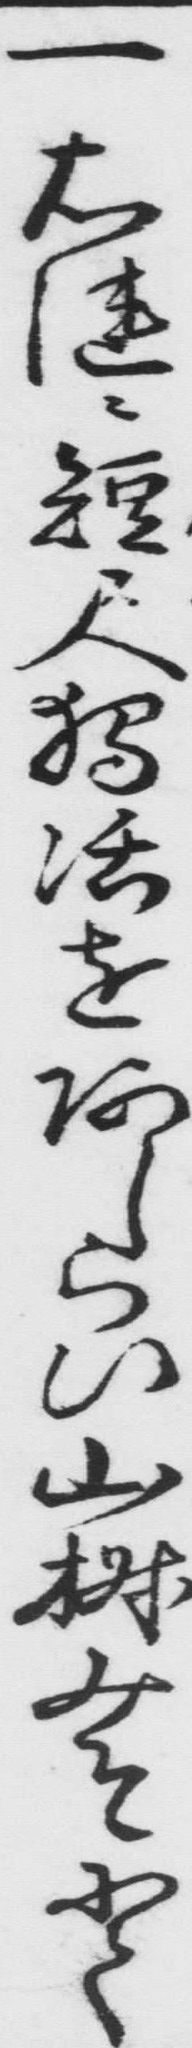一右漣に短尺独活をあしらひ山椒みそ少々
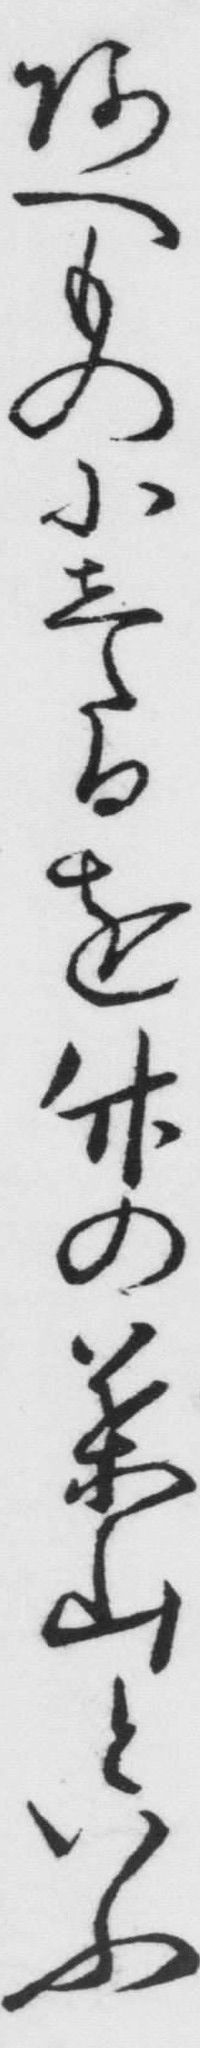あへものにしたるを竹の葉山といふ
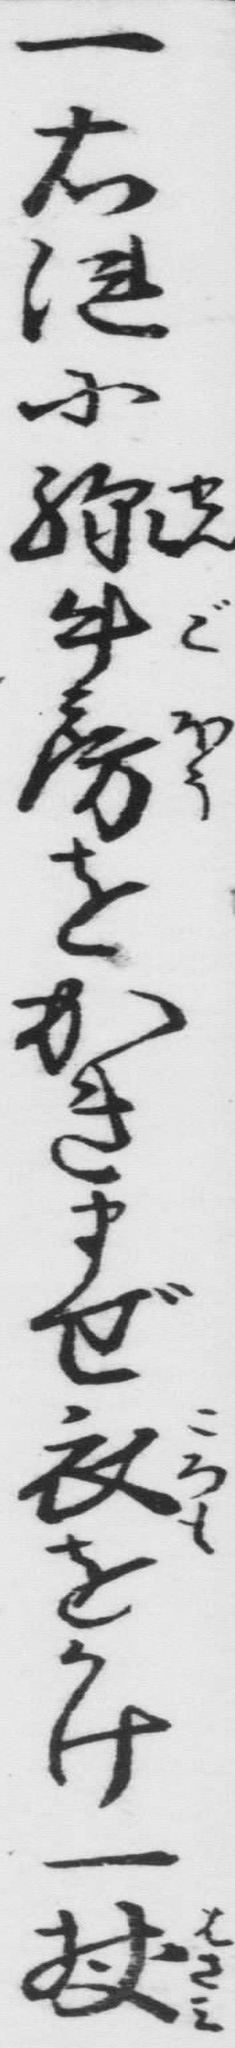一右漣に線牛蒡をかきまぜ衣をかけ一挟
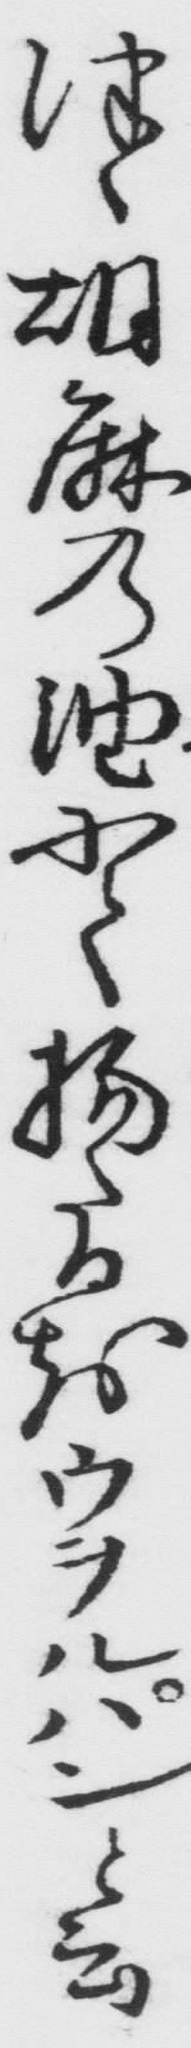つゝ胡麻の油にて揚たるをウヲルパンと云
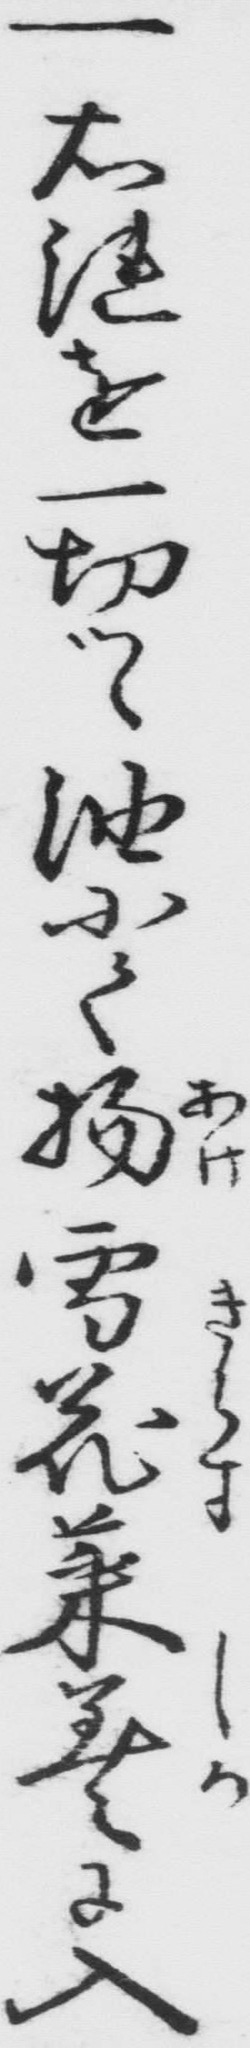一右漣を一切つゝ油にて揚雪花菜羹に入
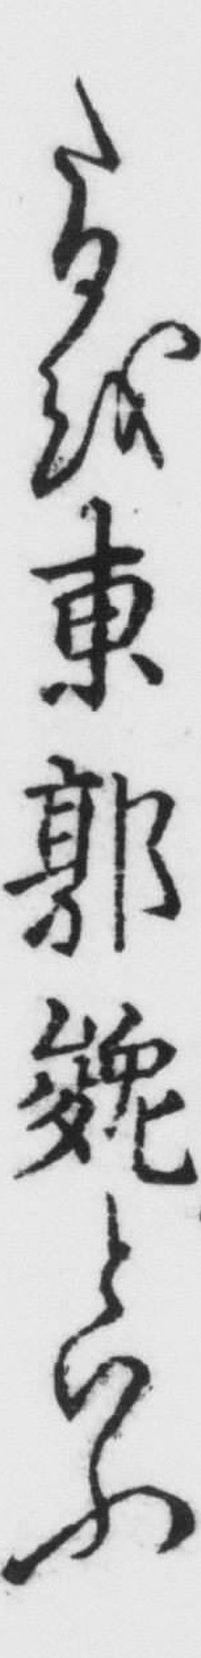たるを東郭㕙といふ

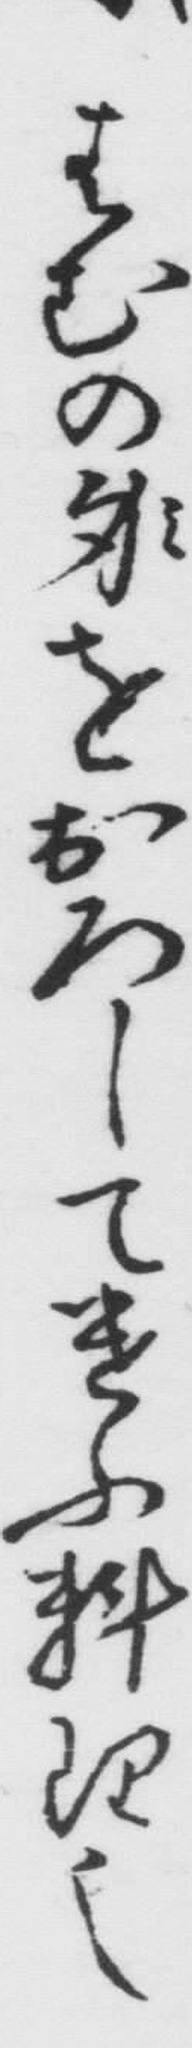肉はむの身をおろして遣ふ料理也
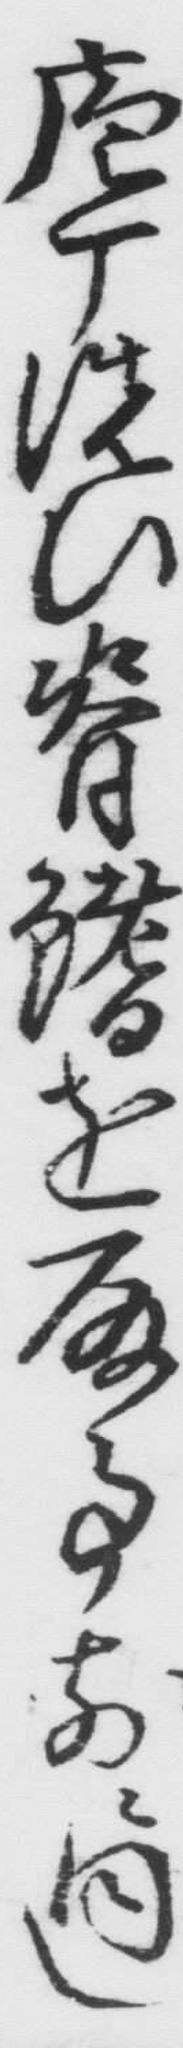庖丁洗ひ脊鰭を取事前に同し
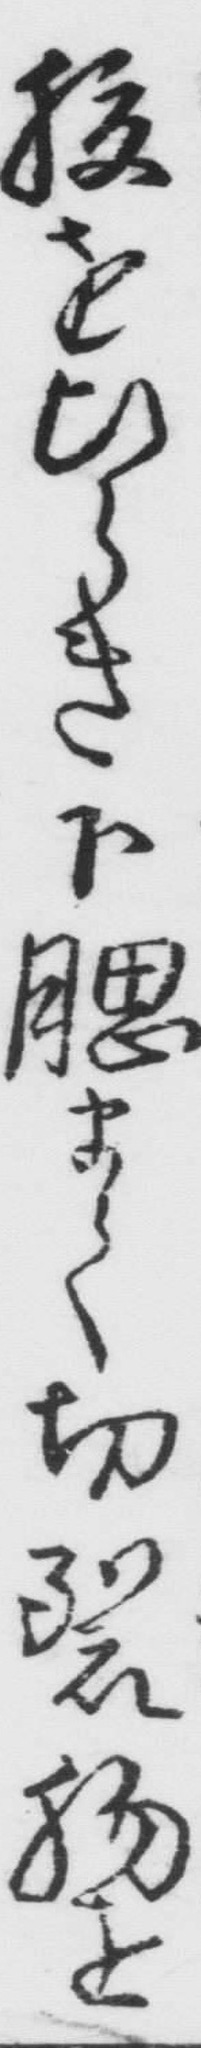腹をひらき下腮まて切裂腸を
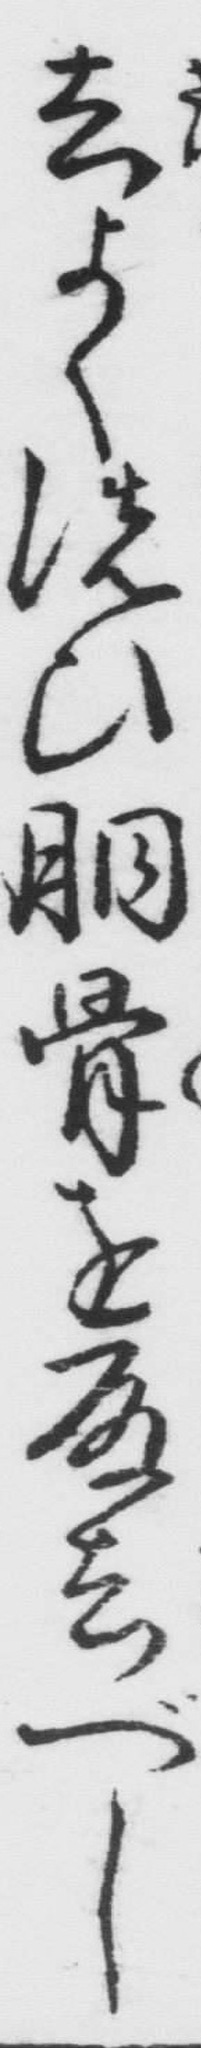去よく洗ひ胴骨を取去べし
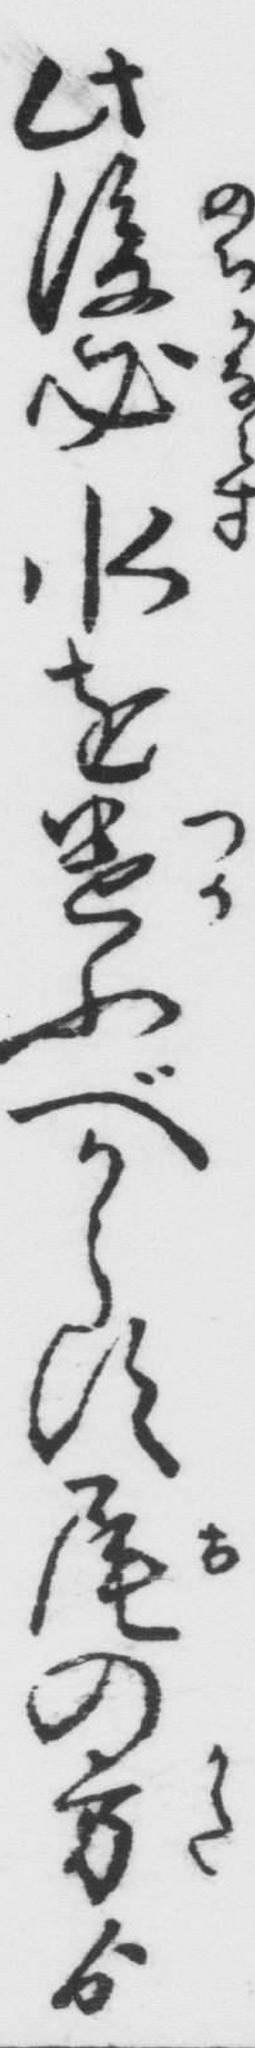此後必水を遣ふべからす尾の方ゟ
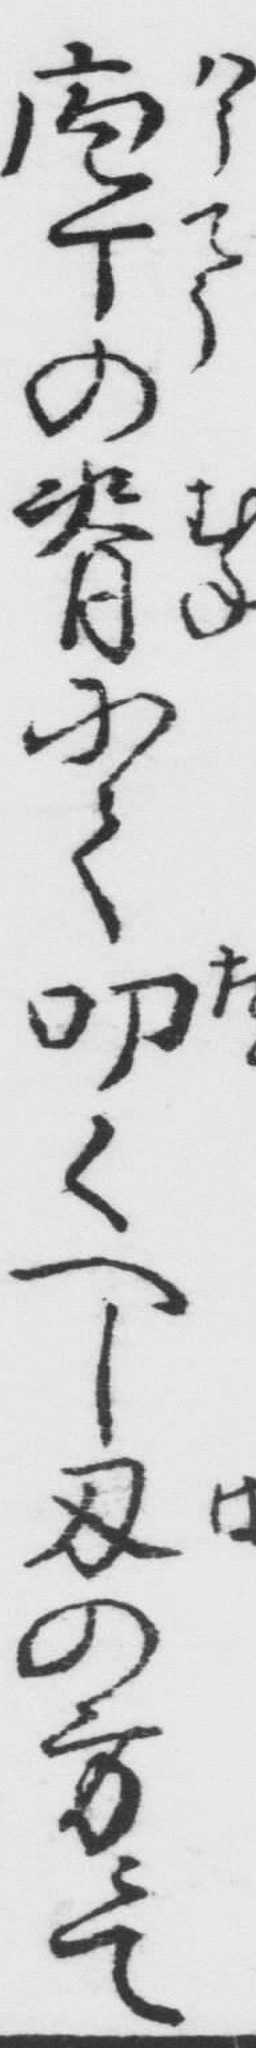庖丁の脊にて叩くへし刃の方にて
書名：海鰻百珍
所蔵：大阪府立大学学術情報センター 国文学研究資料館
